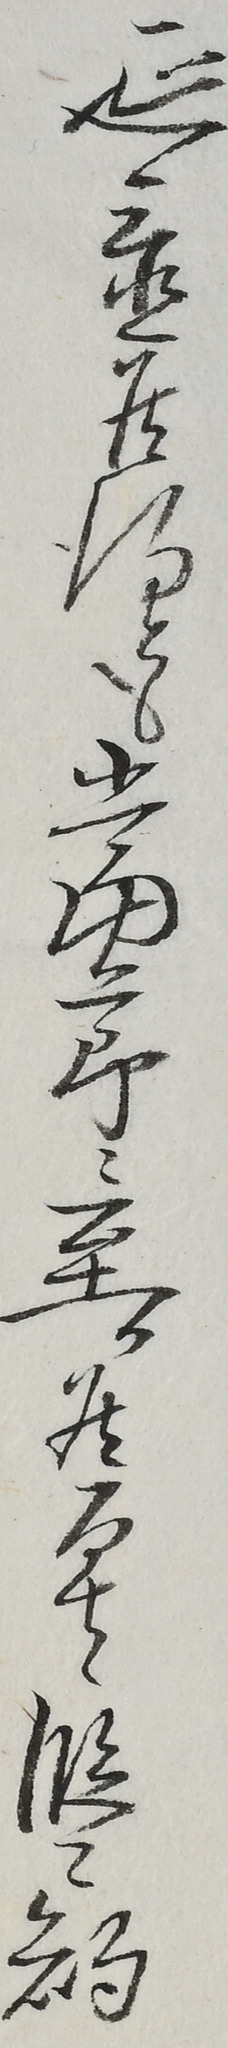延置候得とも当節ニ至リ候而者段々約
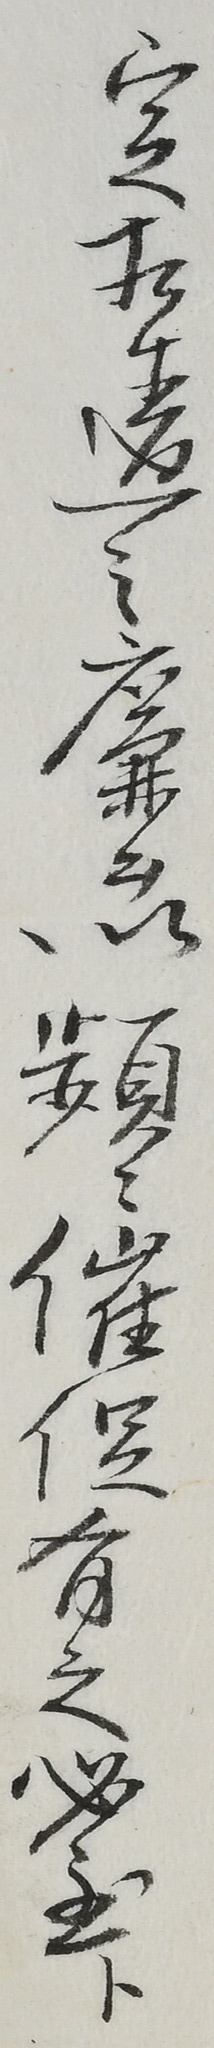定相違可之廉ヲ以頻ニ催促有之必至ト
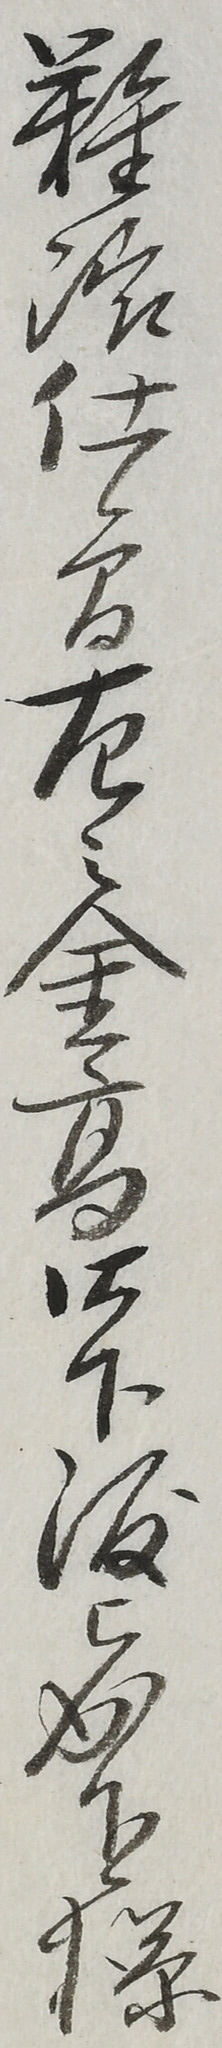難渋仕候間左之金高御下渡被成下候様

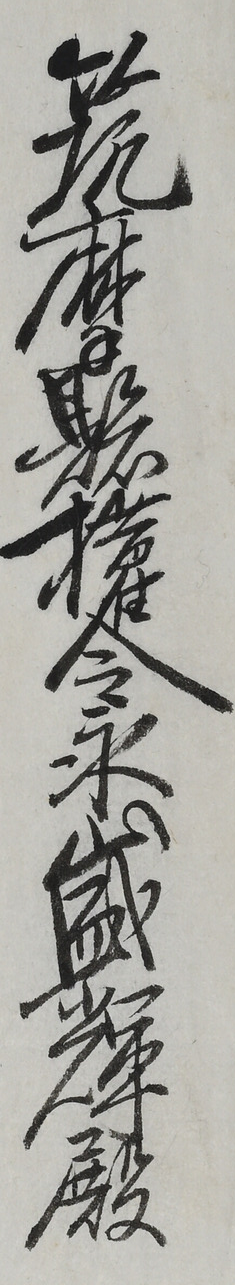筑摩県権令永山盛輝殿
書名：乍恐以書付奉願上候
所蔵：伊那市立高遠町図書館・合同会社AMANE
